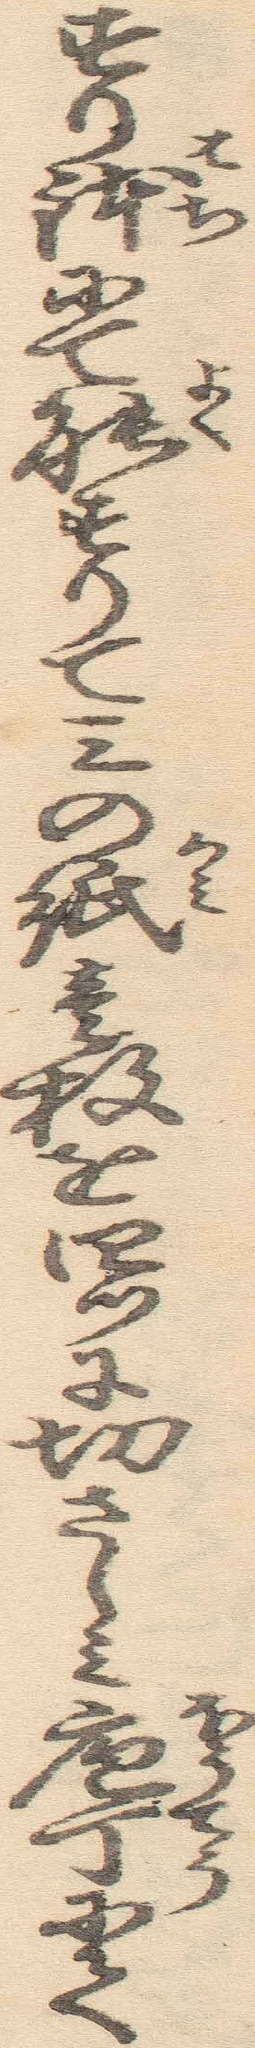すり鉢にて能すりてみの紙壱枚を四つに切さしみ包丁にて
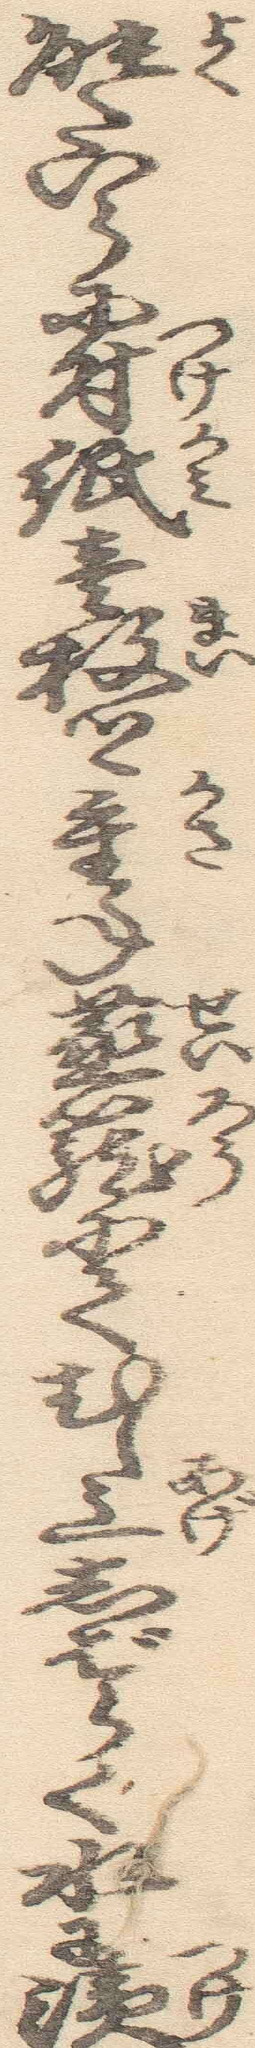能たいらに付紙壱枚つゝ重ね蒸籠にてむし上しばらく水に漬
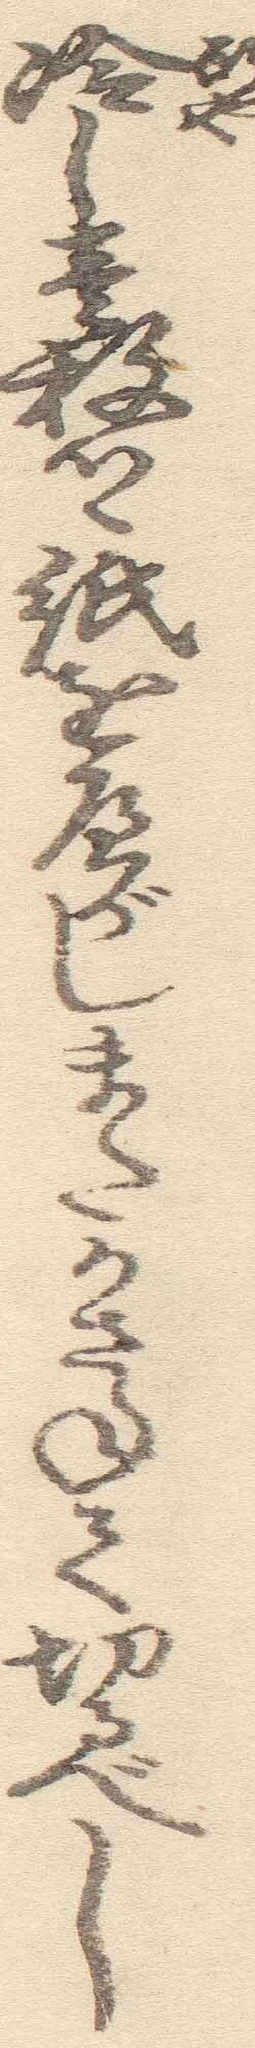冷し壱枚つゝ紙をへがしまたかさねて切るべし
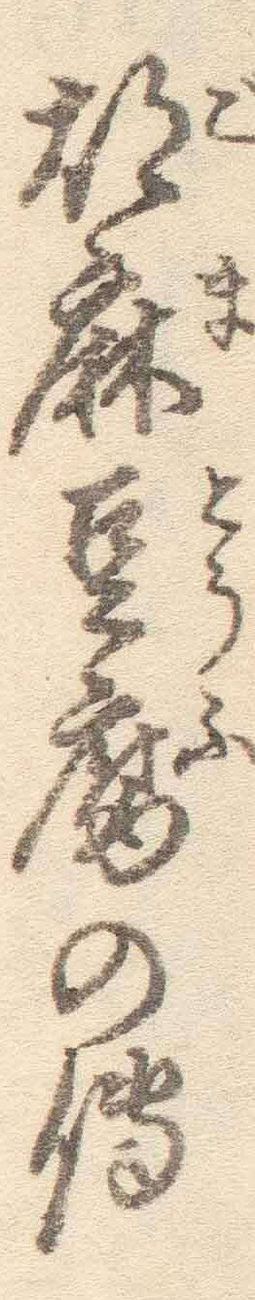胡麻豆腐の伝
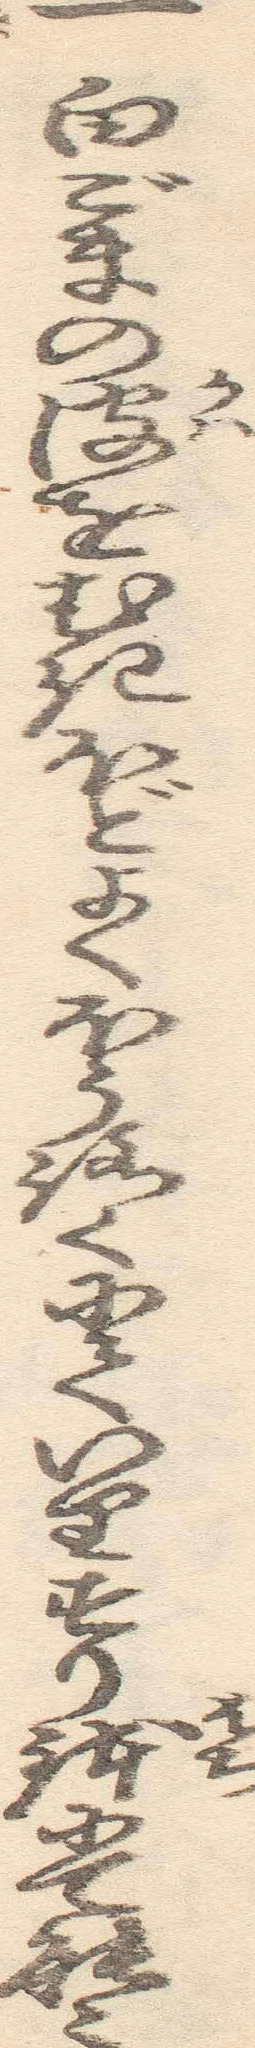一白ごまの皮をむきほどよくほうろくにていりすり鉢にて能々
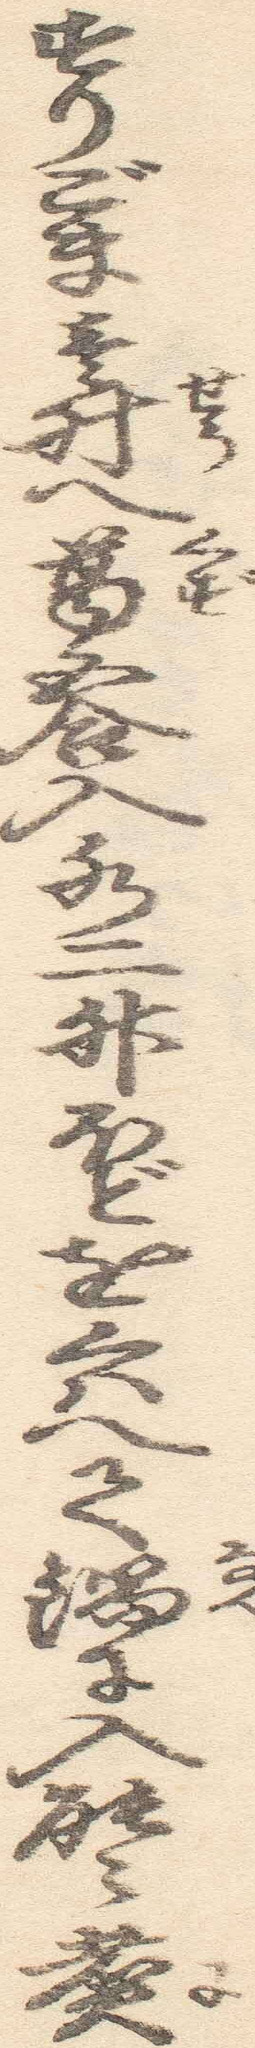すりごま壱升へ葛五合入水二升ほどをくはへて鍋に入能々煮
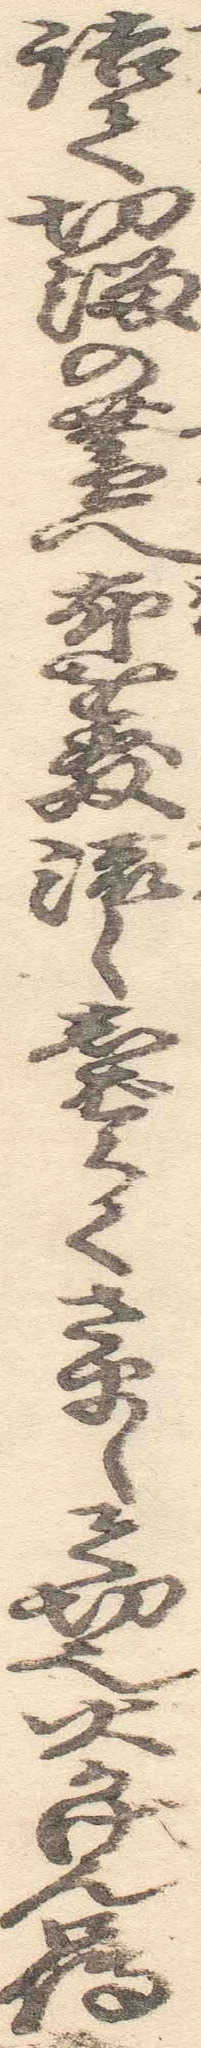詰て切溜の蓋へ布を敷流ししばらくさまして切也火かげん口伝
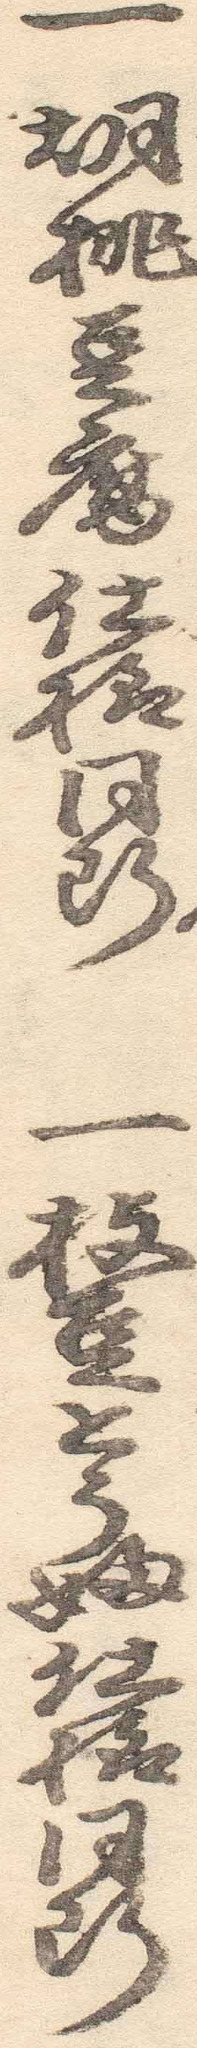一胡桃豆腐仕様同断一枝豆とうふ仕様同断
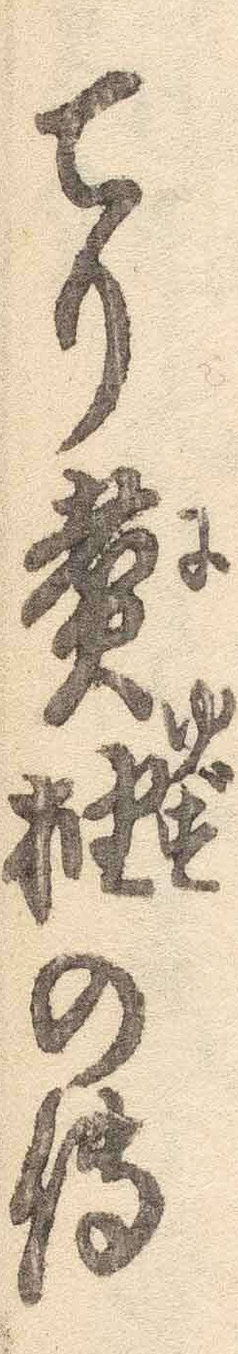てり煮柚の伝
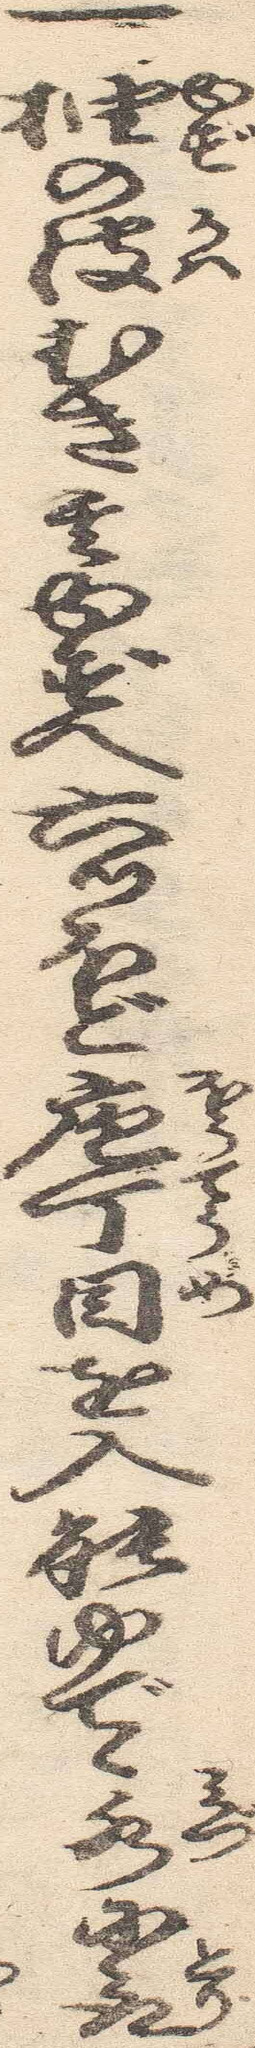一柚の皮むき其ゆずへ六つほど包丁目を入能ゆでゝ水に取
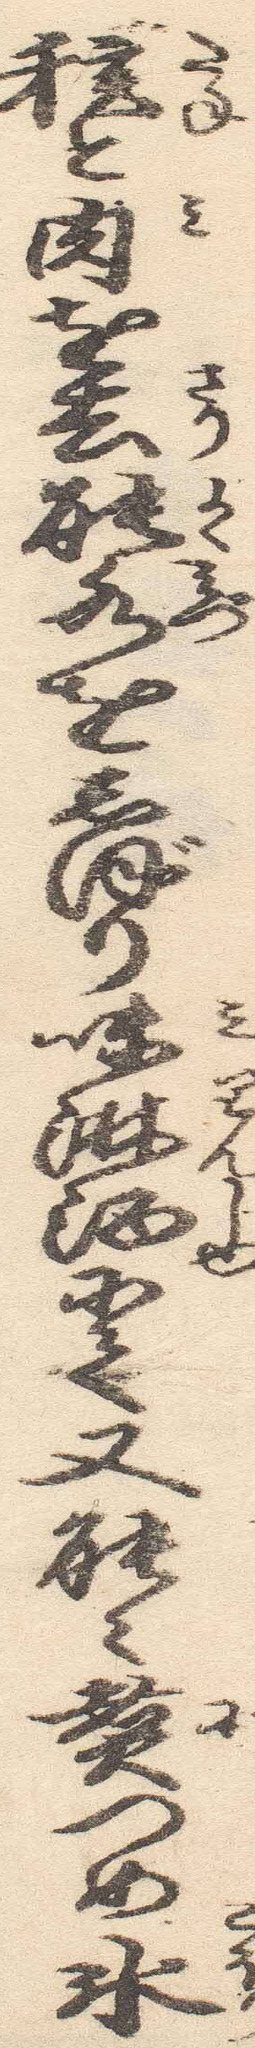𥞨と肉を去能水をしぼり味淋酒にて又能々煮つめ氷
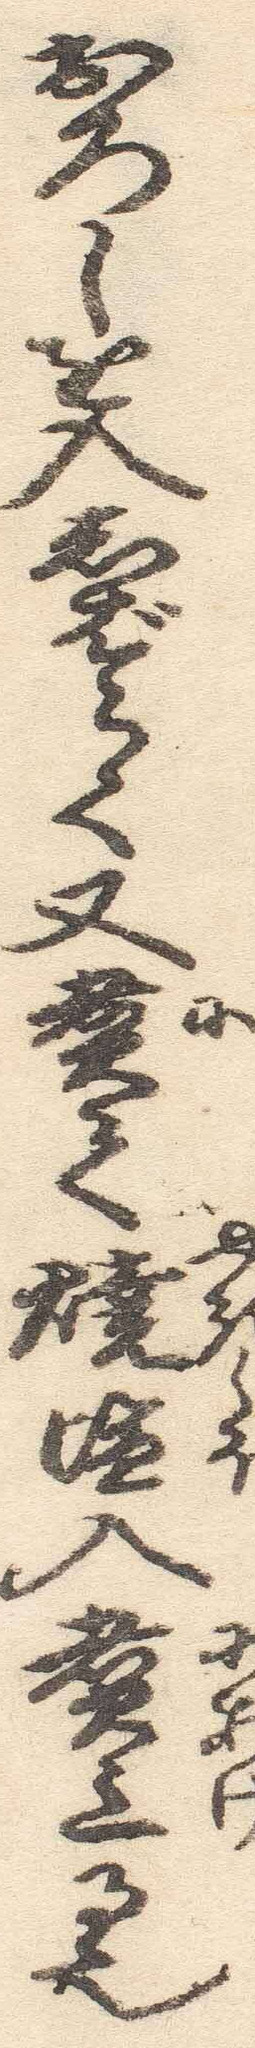おろしを入しばらく又煮て焼塩入煮上る也
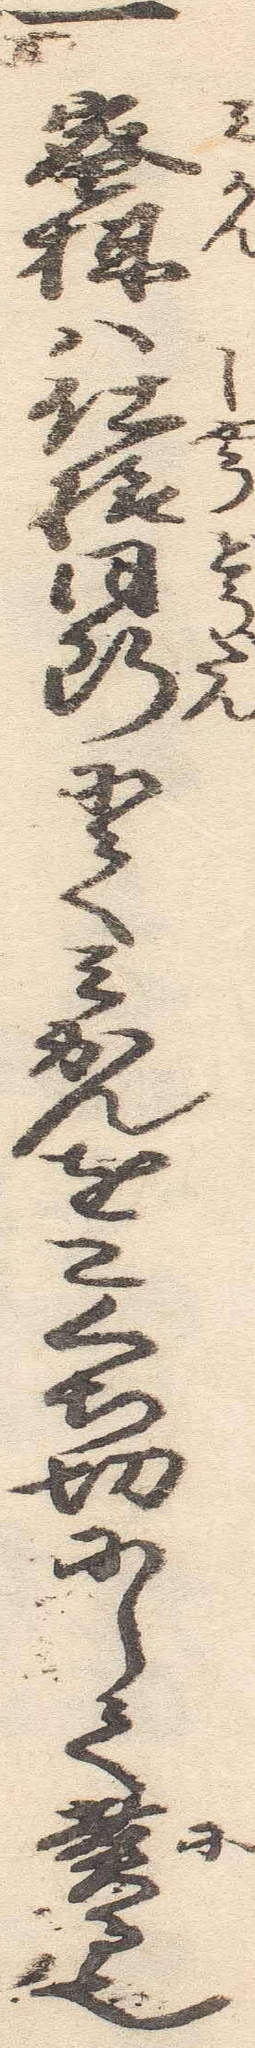一蜜柑は仕様同断にてみかんをこくち切にして煮る也
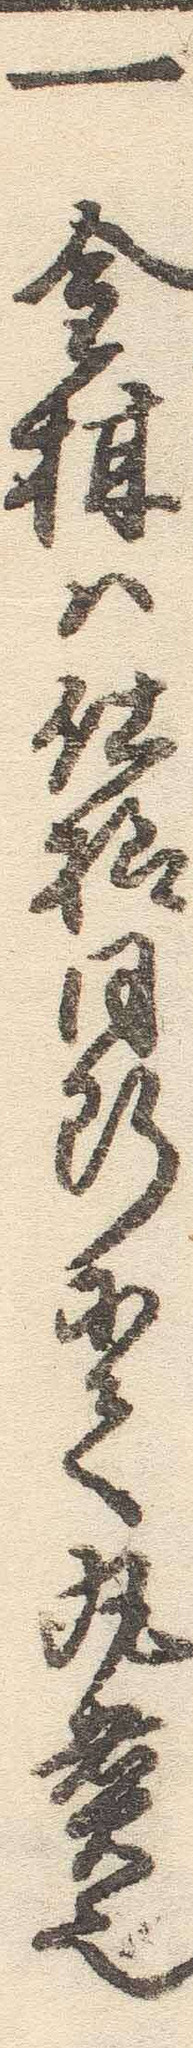一金柑は仕様同断にて丸煮也
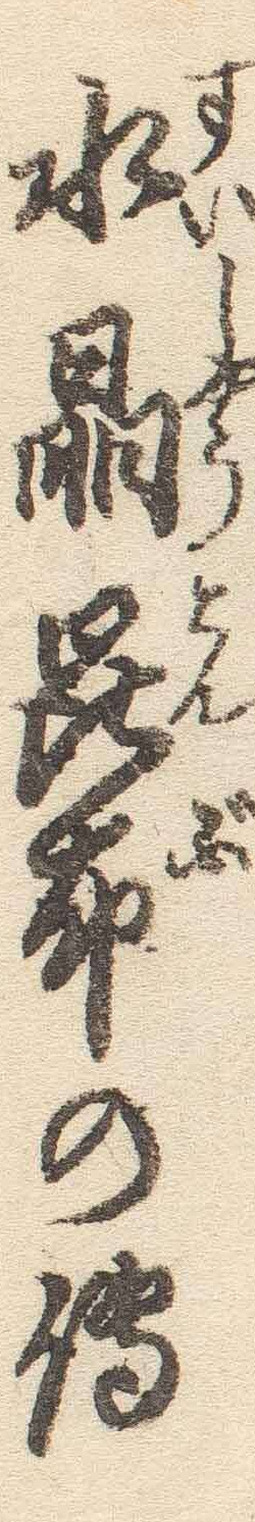水晶昆布の伝
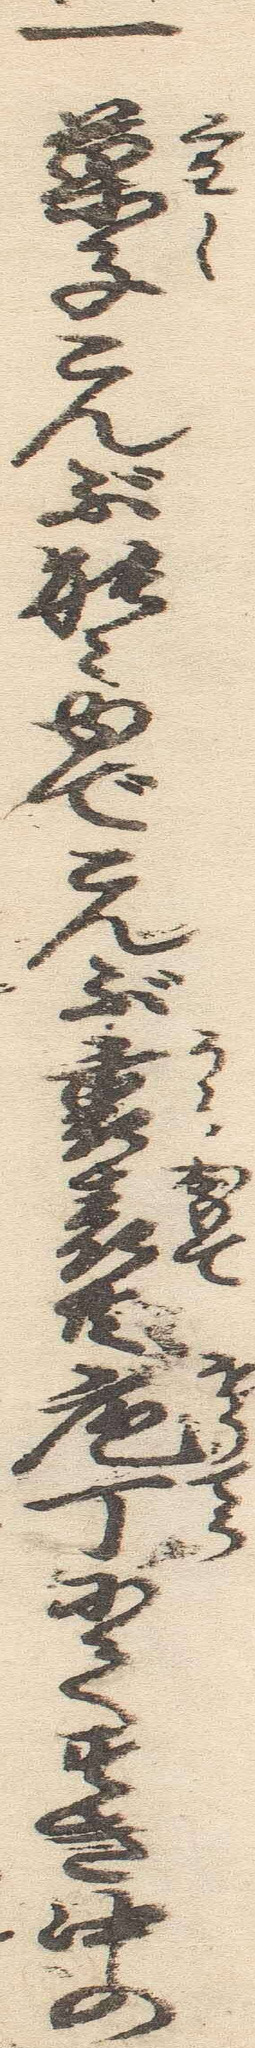一菓子こんぶ能々ゆでこんぶ裏表共包丁にてすき中の
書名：料理通
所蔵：東京学芸大学附属図書館 国文学研究資料館
